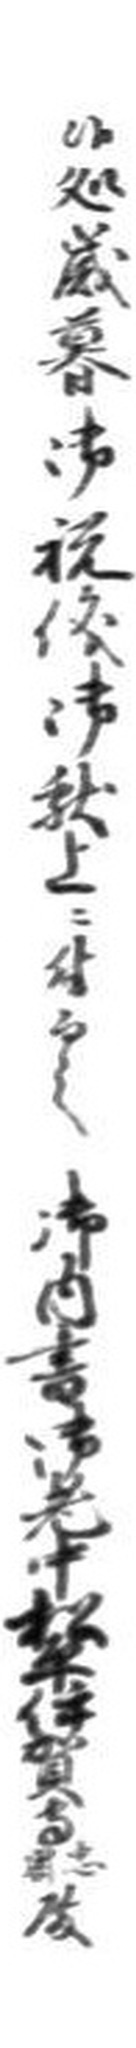候処歳暮御祝儀御献上似ニ付而之御内書御老中松平伊賀守忠周殿
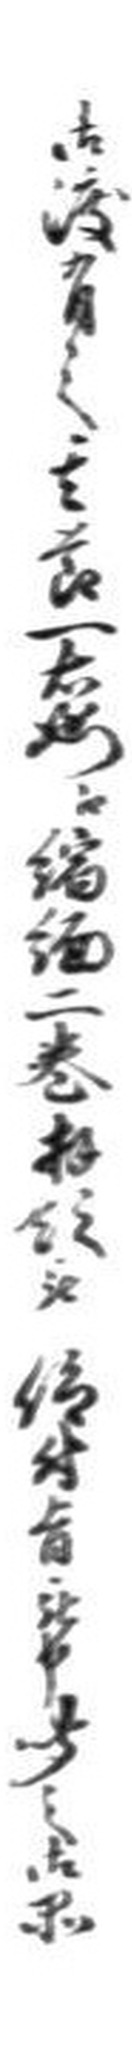御渡有之其節一右衛門江縮緬二巻拝領被仰付旨被申聞之御品
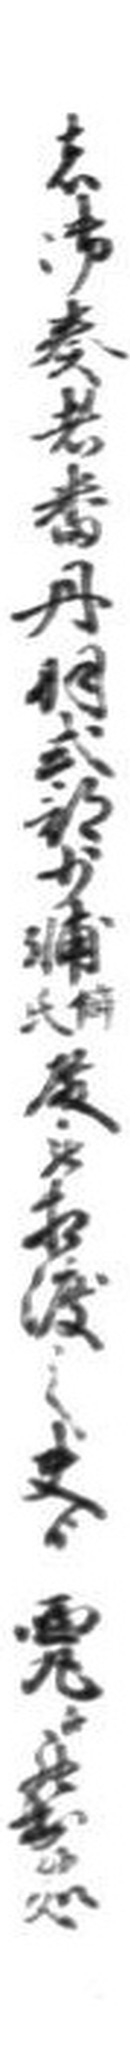者御奏者番丹羽式部少輔氏殿被相渡之夫ゟ西丸江罷出候処
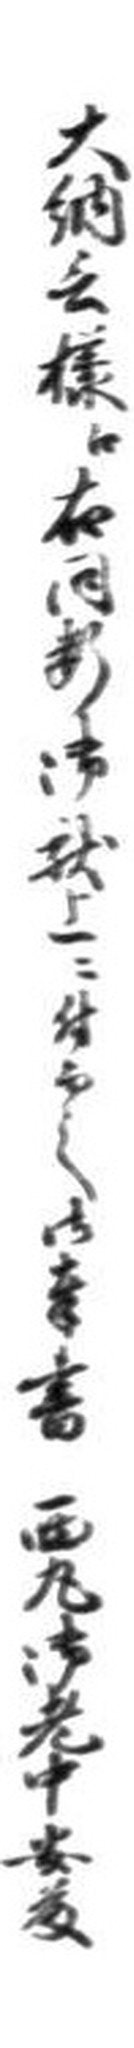大納言様江右同断御献上ニ付而之御奉書西丸御老中安藤
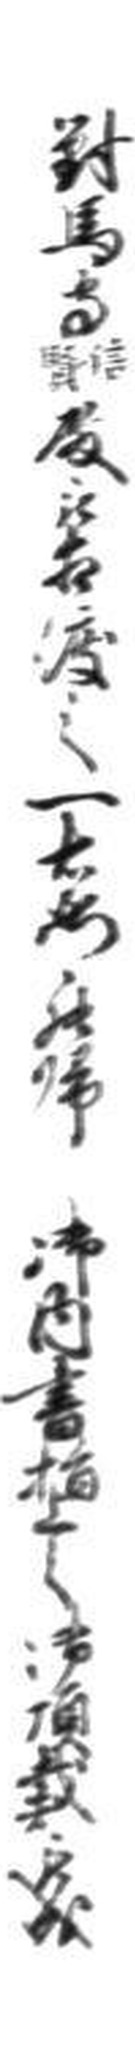対馬守信賢殿被相渡之一右衛門罷帰御内書指上之御頂戴被成
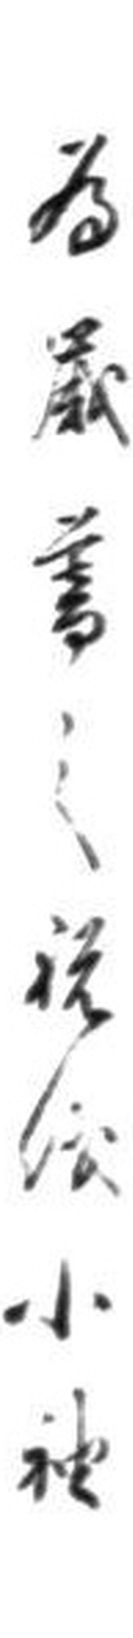為歳暮之祝儀小袖
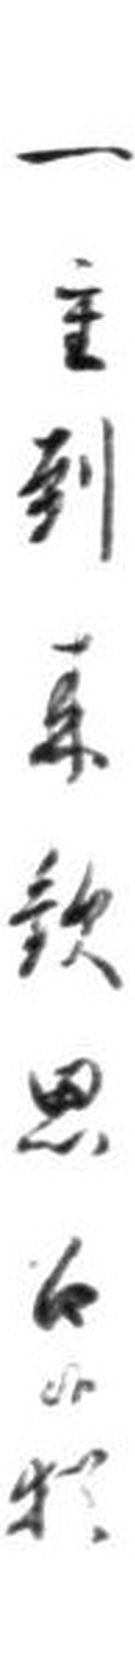一重到来歓思召候猶

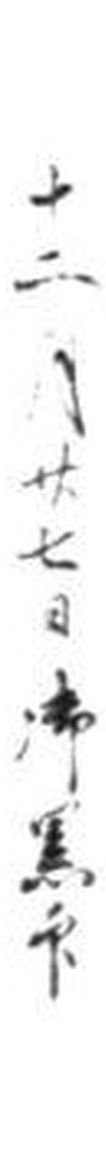十二月廿七日御黒印
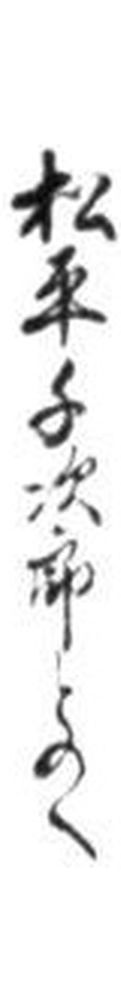松平千次郎とのへ
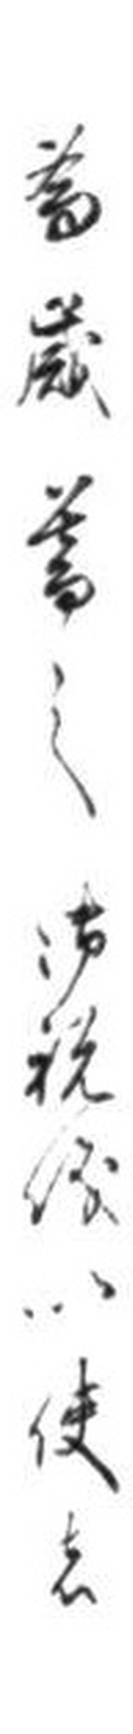為歳暮之御祝儀以使者
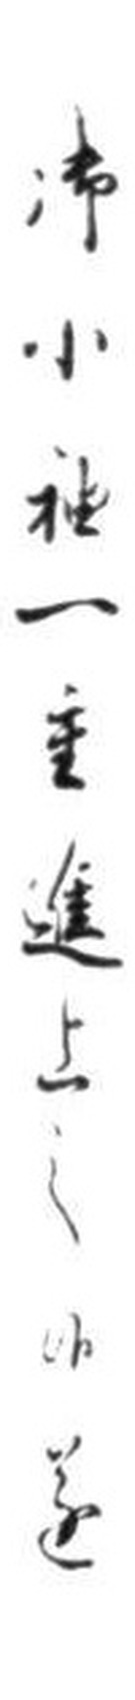御小袖一重進上之候遂
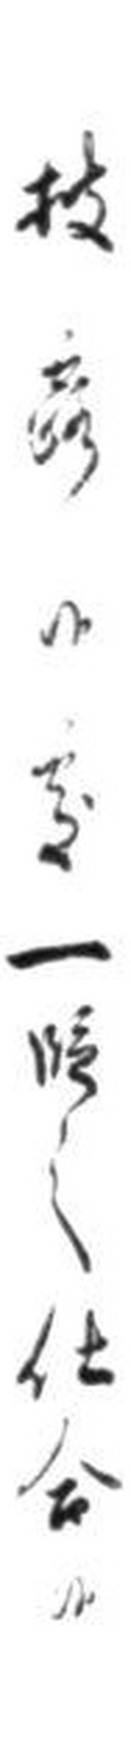披露候處一段之仕合候
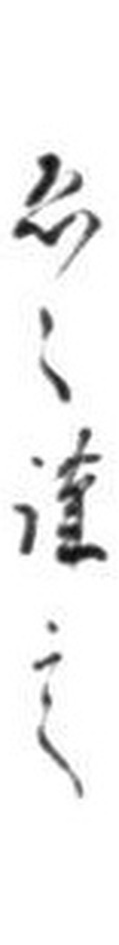恐々謹言
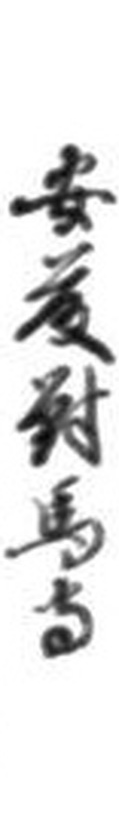安藤対馬守
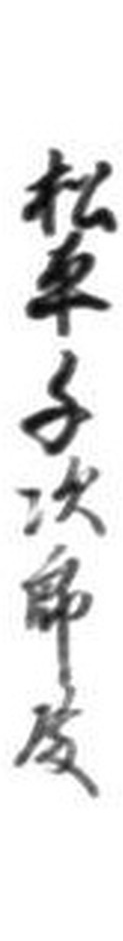松平千次郎殿
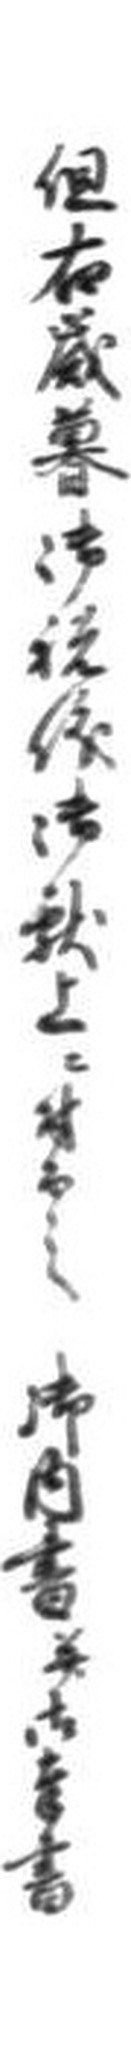但右歳暮御祝儀御献上ニ付而之御内書并御奉書
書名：家譜 四十 宗矩公 従享保十一年到享保十二年
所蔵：福井県文書館 Fukui Prefectural Archives
